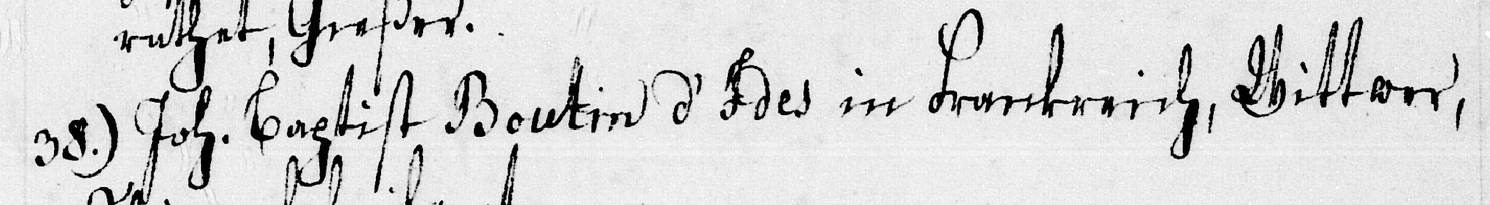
38.) Joh. Baptist Boutin d’Ides in Frankreich, Wittwer,
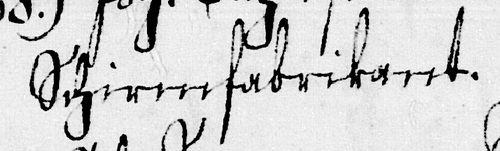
Schirmfabrikant.
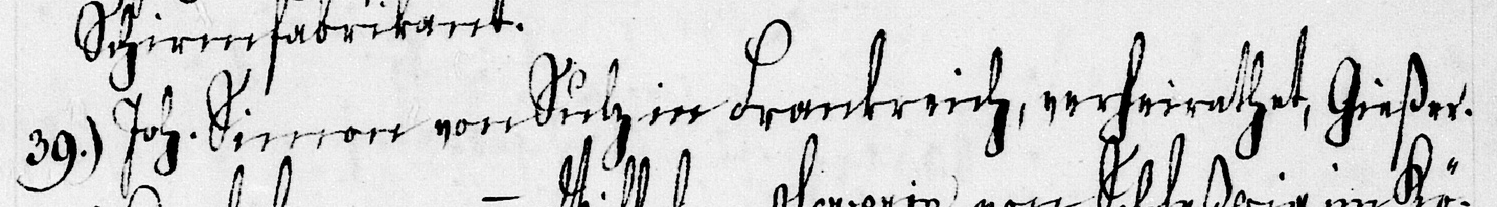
39.) Joh. Simon von Sulz in Frankreich, verheirathet, Gießer.
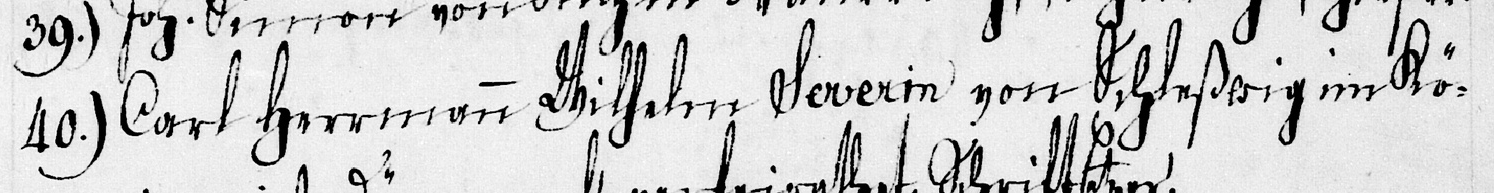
40.) Carl Hermann Wilhelm Severin von Schleßwig im Kö¬
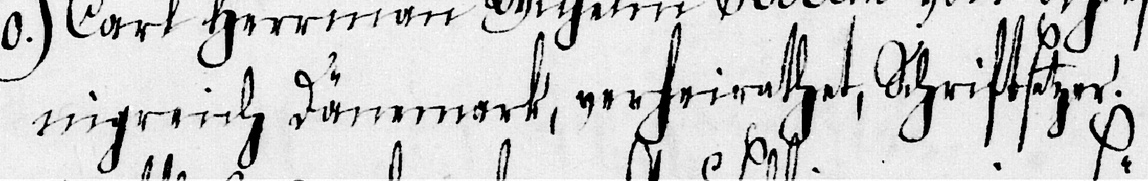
nigreich Dänemark, verheirathet, Schriftsetzer.
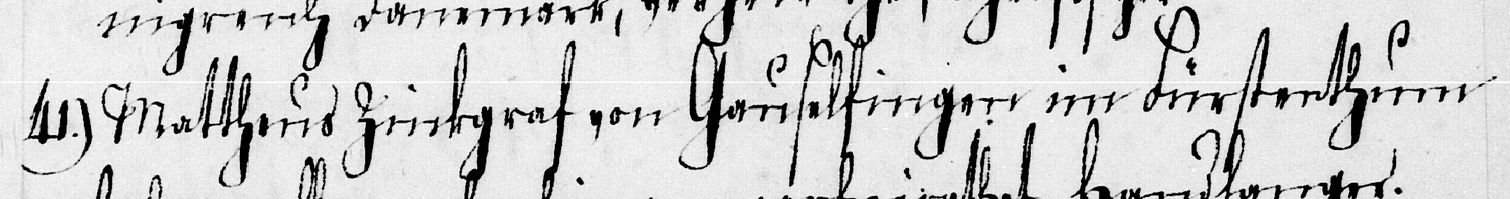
41.) Mattheus Zinkgraf von Gauselfingen im Fürstenthum
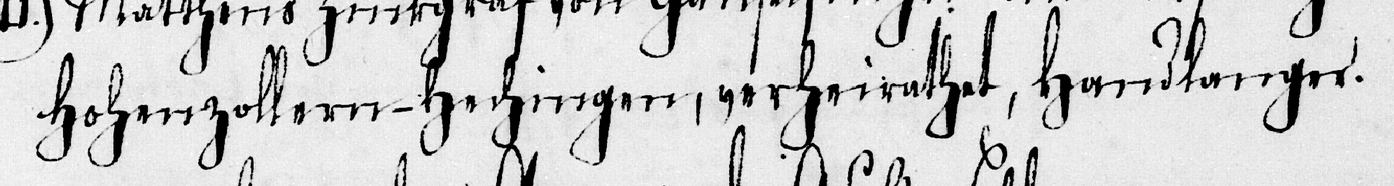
Hohenzollern-Hechingen, verheirathet, Handlanger.
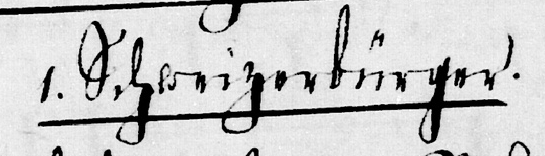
1. Schweizerbürger.
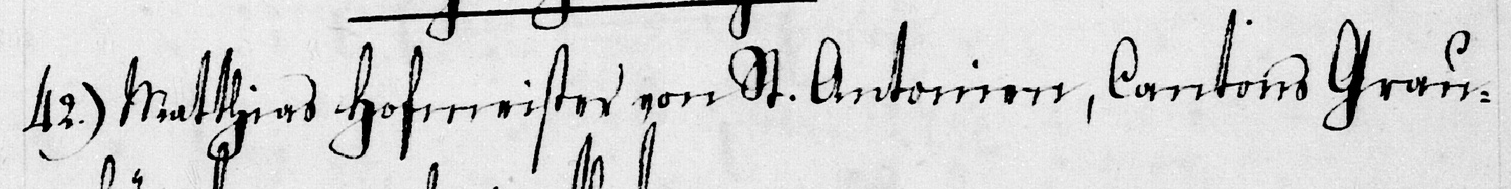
42.) Matthias Hofmeister von St. Antonien, Cantons Grau¬
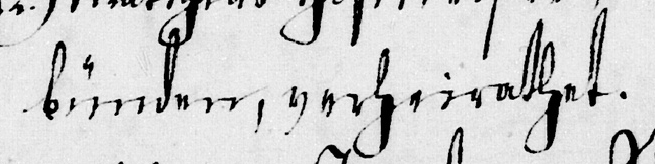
bünden, verheirathet.
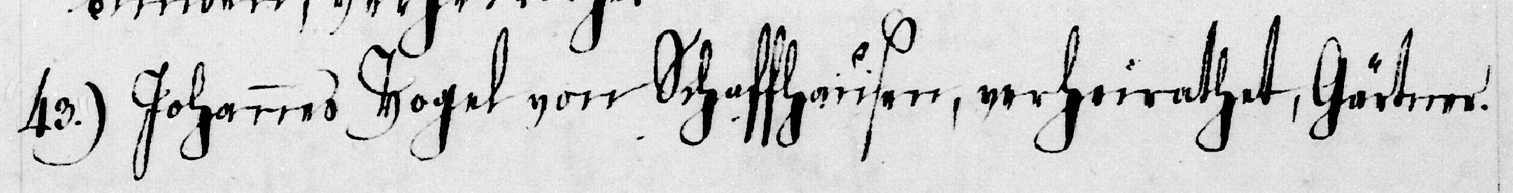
43.) Johannes Vogel von Schaffhausen, verheirathet, Gärtner.
